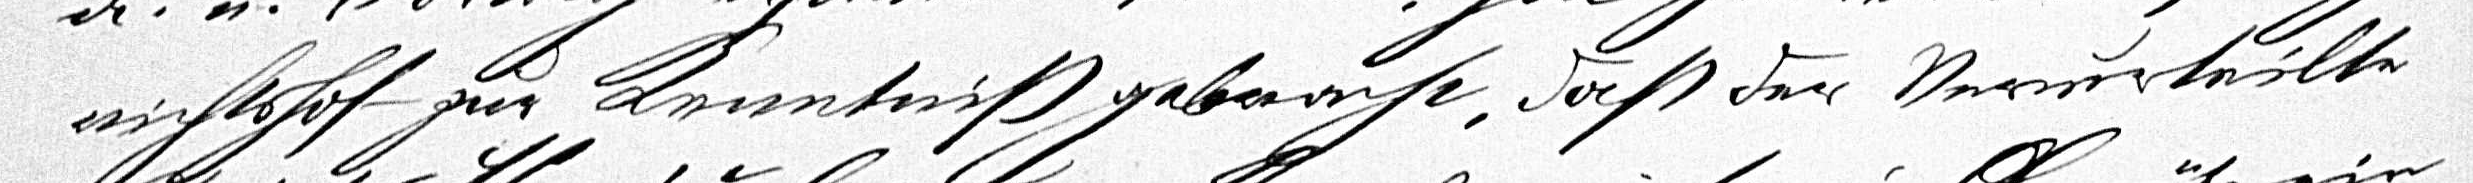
richtshof zur Kenntniß gebracht, daß der Verurteilte
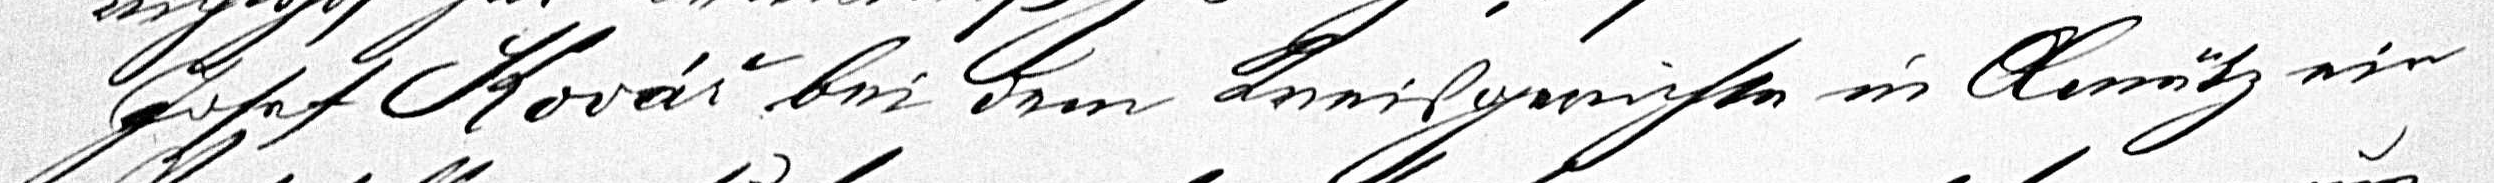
Josef Kovár bei dem Kreisgerichte in Olmütz ein
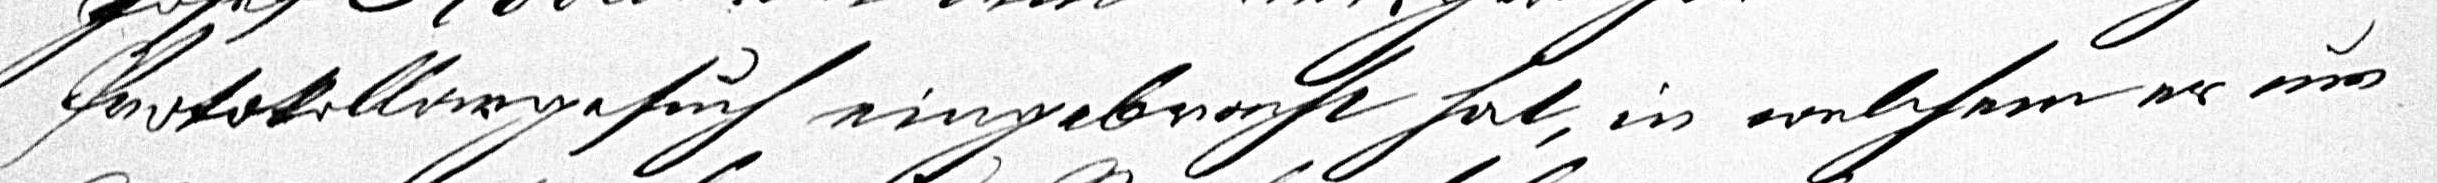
Protokollxxgesuch eingebracht hat, in welchem er um
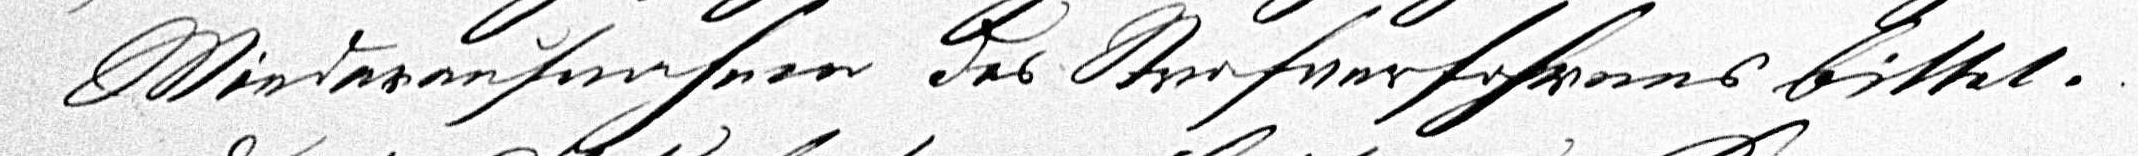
Miederaufnahme des Strafversehrens bittet.
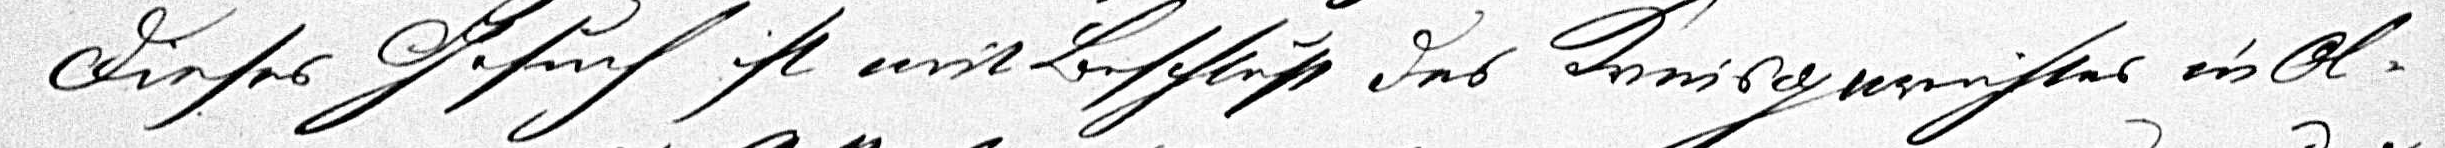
Dieses Gesuch ist mit Beschluß des Kreisgerichtes in Ol¬
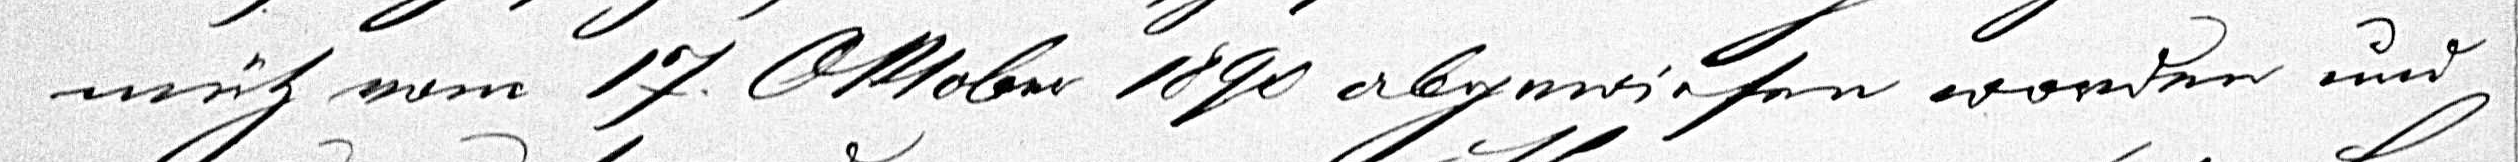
mütz vom 17. Oktober 1890 abgewiesen worden und
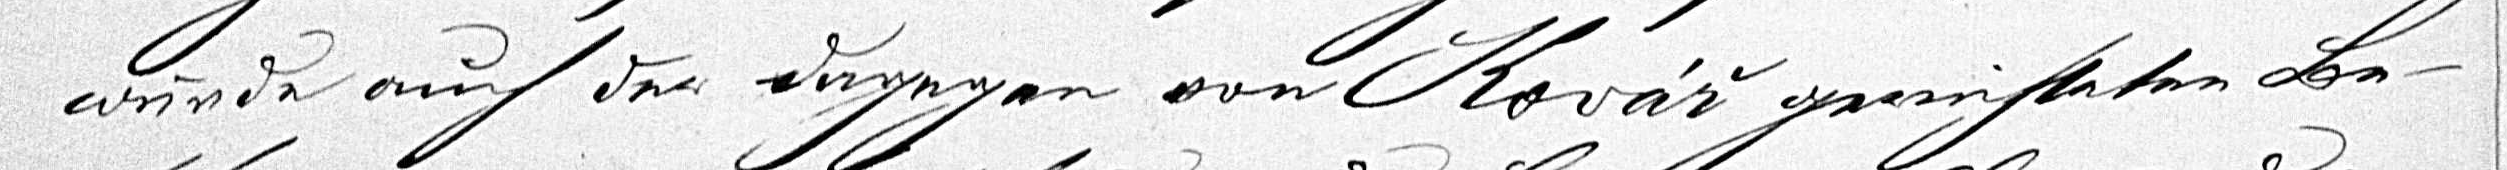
wurde auch der dagegen von Kovár gerichteten Be¬
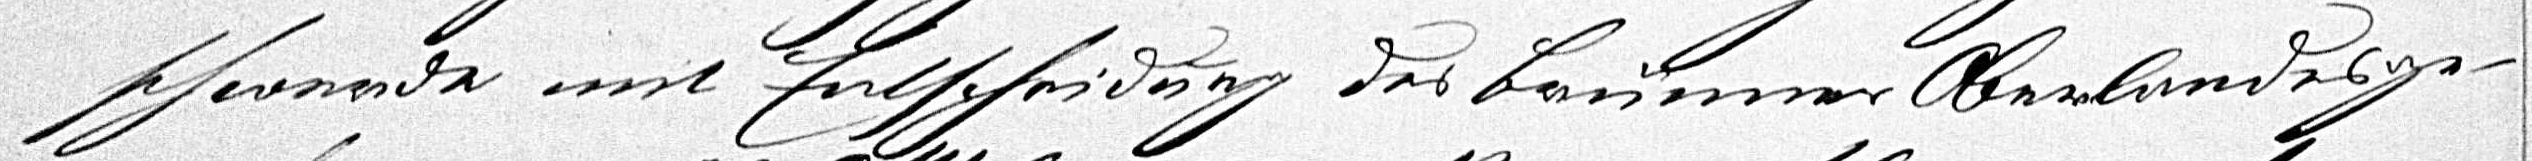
schwerde mit Entscheidung des Brunner Oberlandesge¬
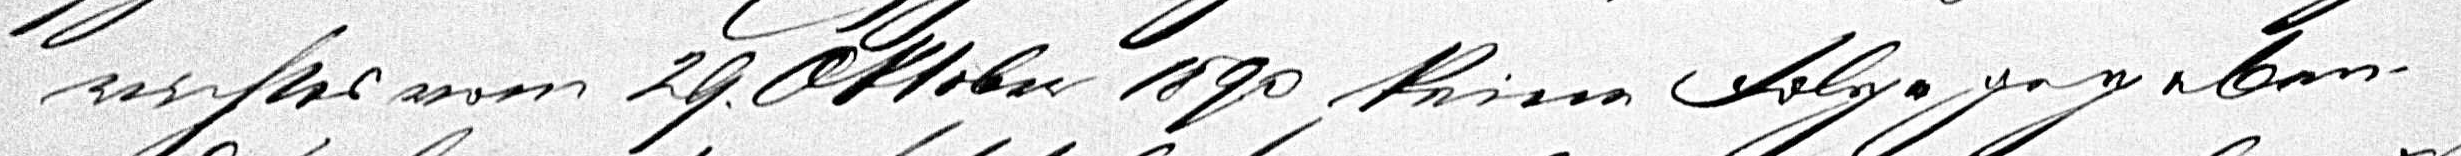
richtes vom 29. Oktober 1890 keine Folge gegeben.
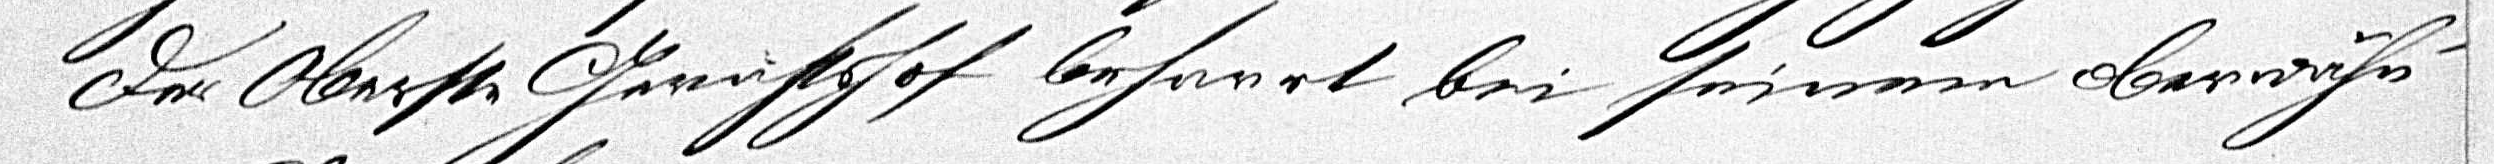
Der Oberste Gerichtshof beharrt bei seinem oberwähn¬
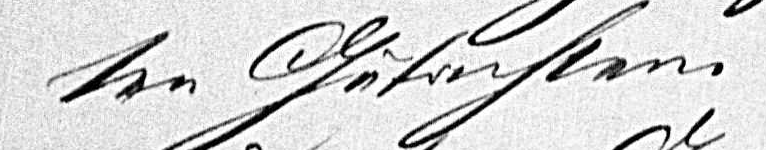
ten Gutachten.
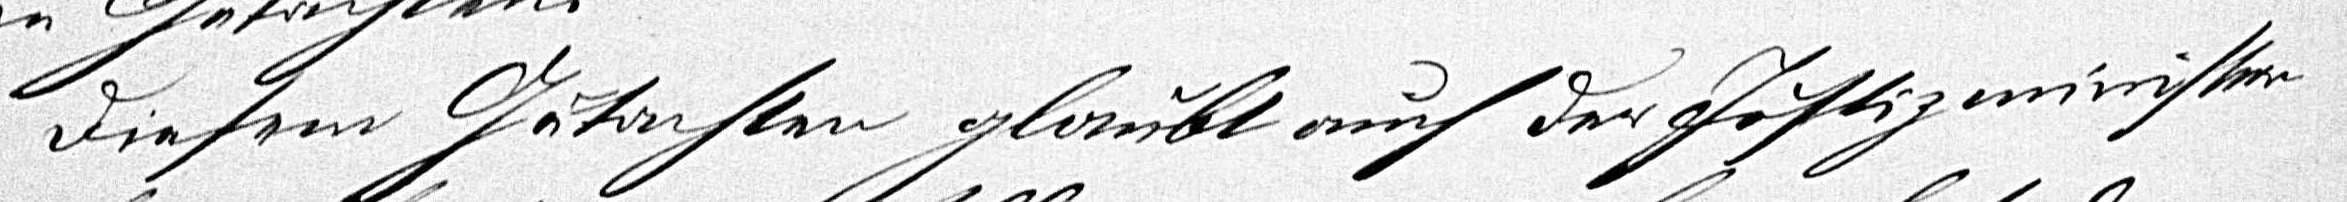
Diesem Gutachten glaubt auch der Justizminister
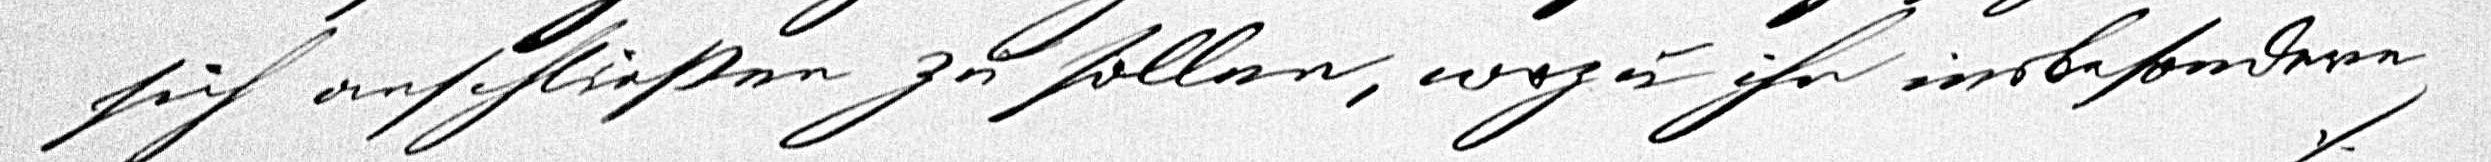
sich anschließen zu sollen, wozu ihn insbesondere
